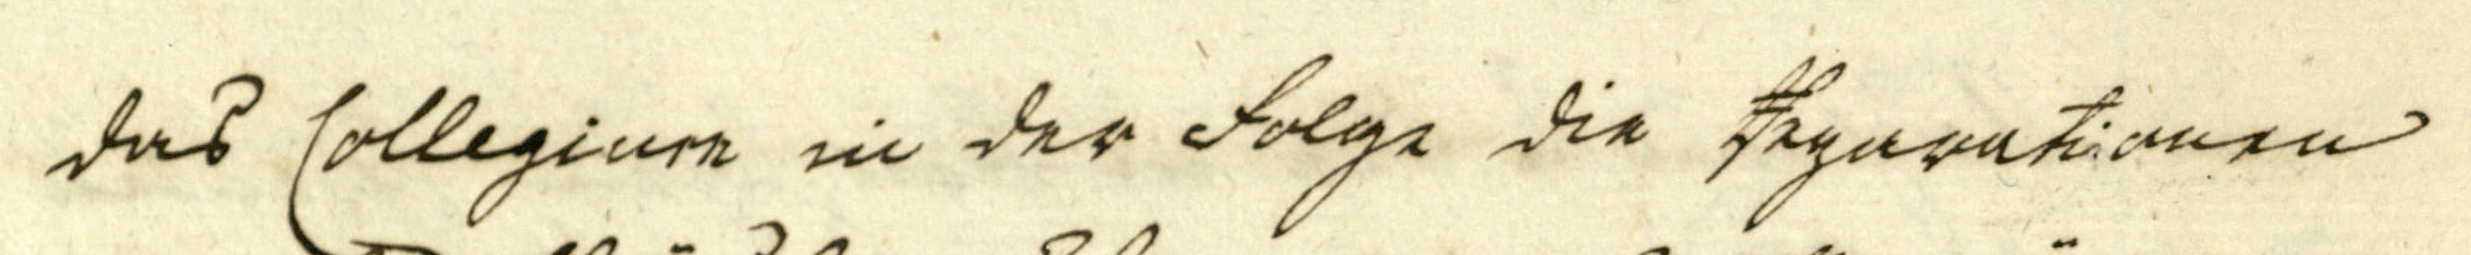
das Collegium in der Folge die Reparationen
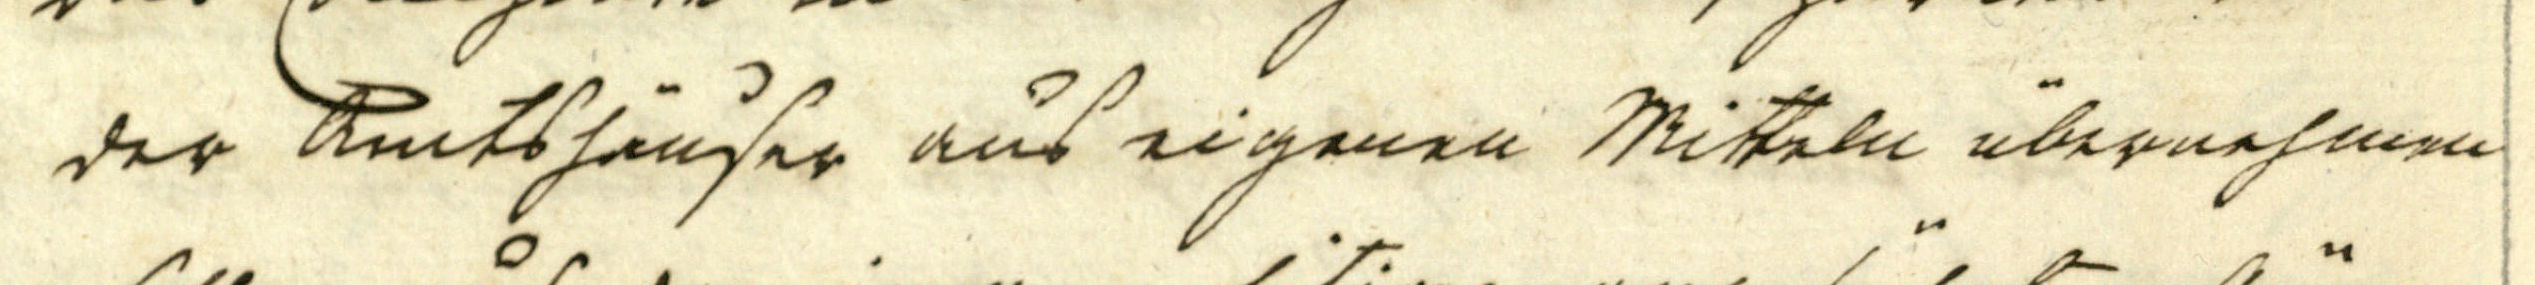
der Amtshäuser aus eigenen Mitteln übernehmen
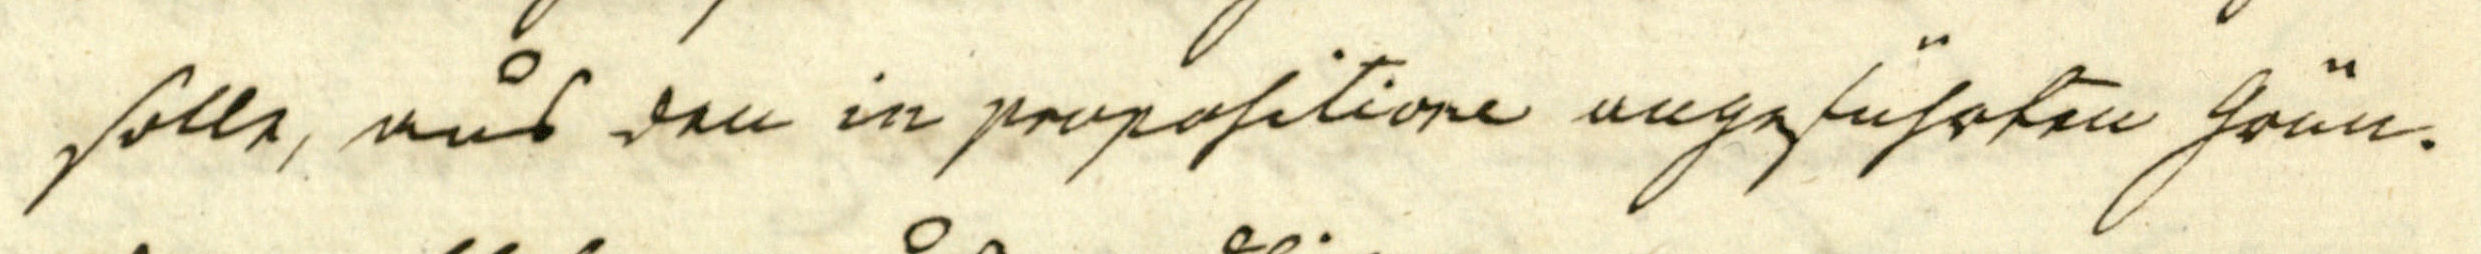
solle, aus den in propositione angeführten Grün¬
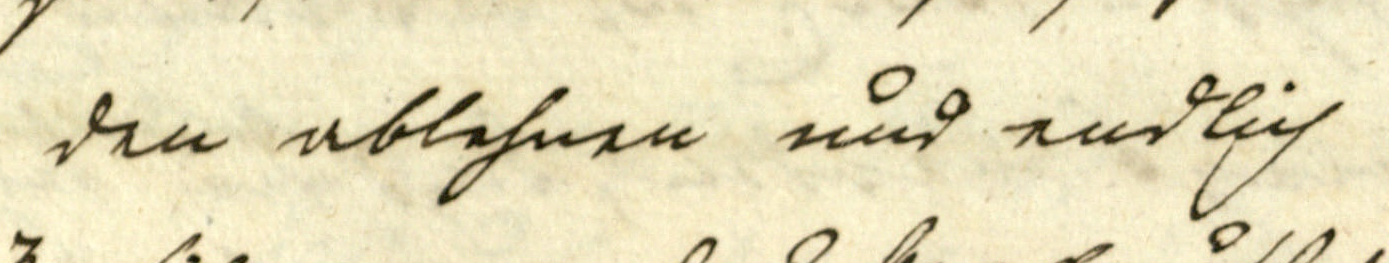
den ablehnen und endlich
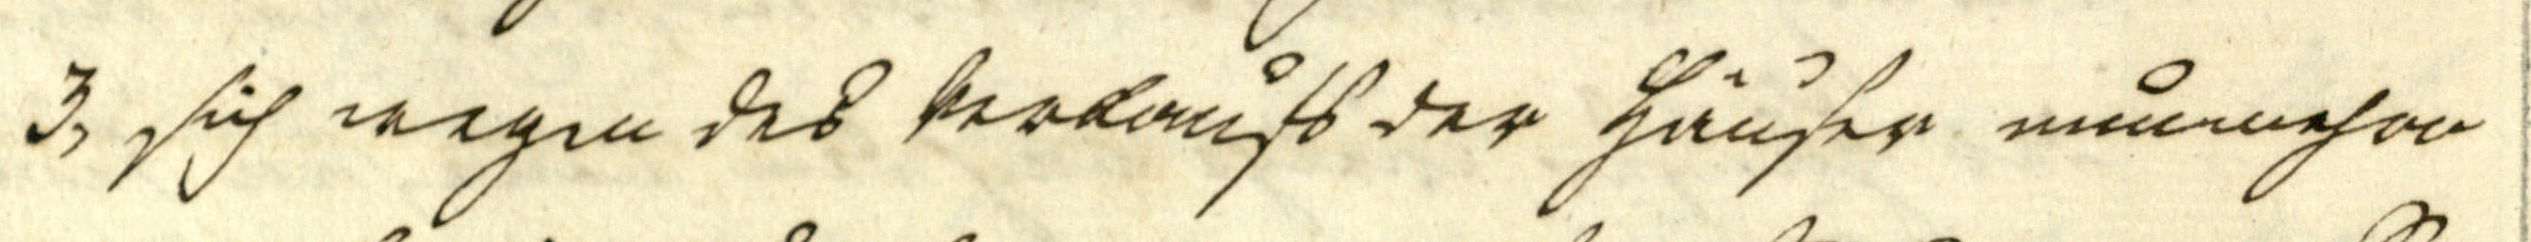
3., sich wegen des Verkaufs der Häuser nunmehro
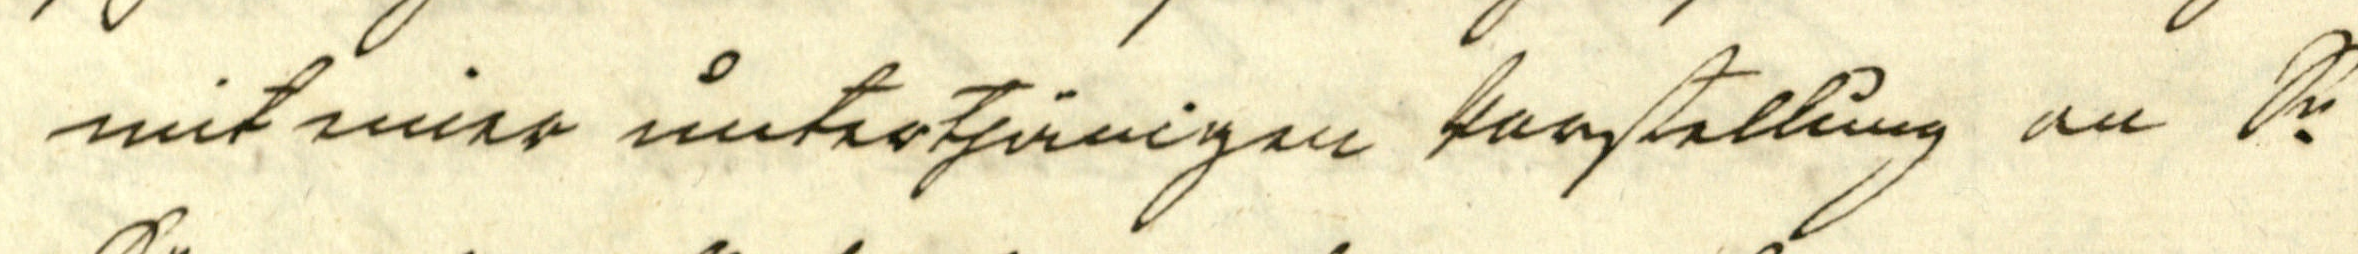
mit einer unterthänigen Vorstellung an Sr.
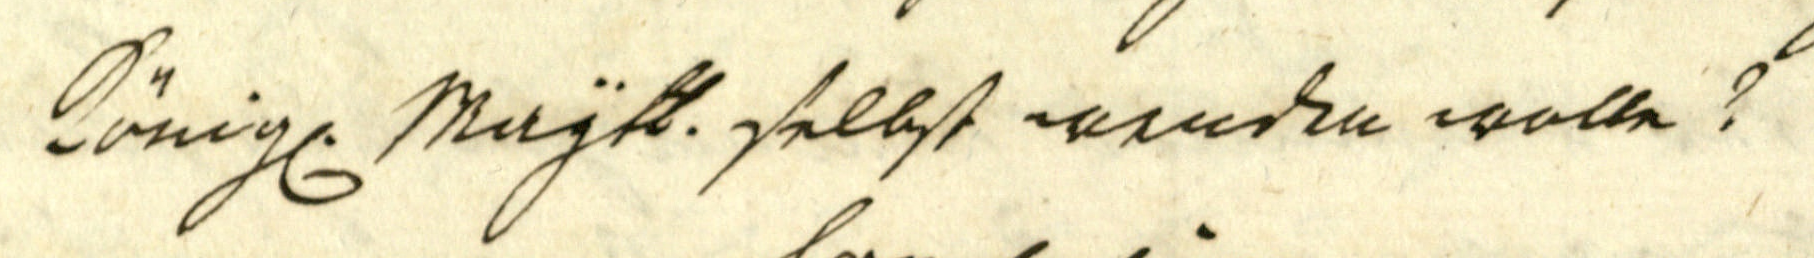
Königl. Maÿtt. selbst wenden wolle?
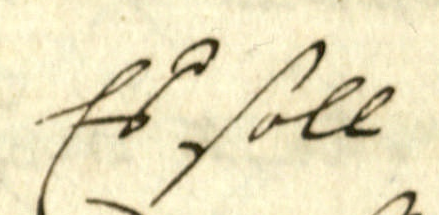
Es soll
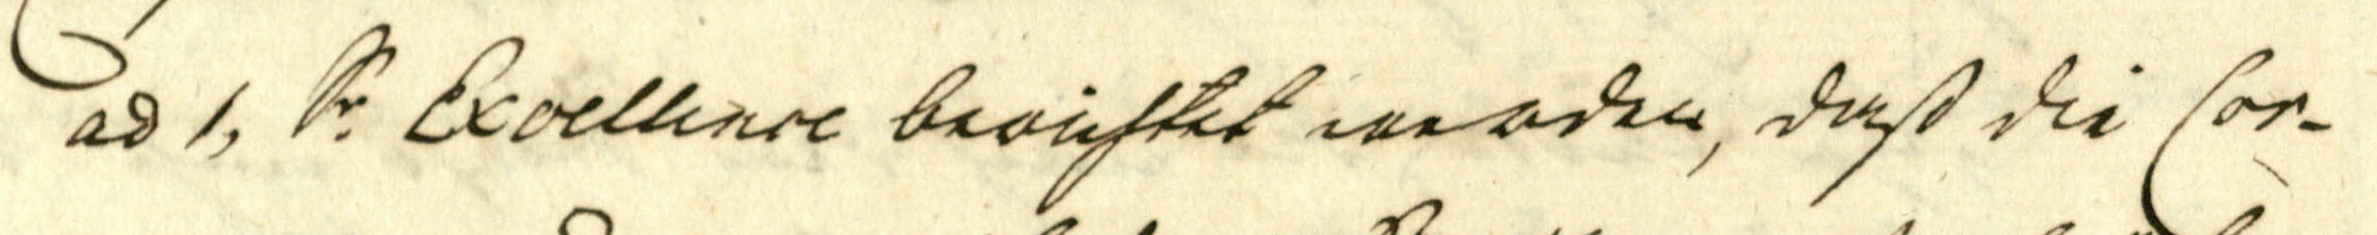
ad 1, Sr Excellence berichtet werden, daß die Cor¬
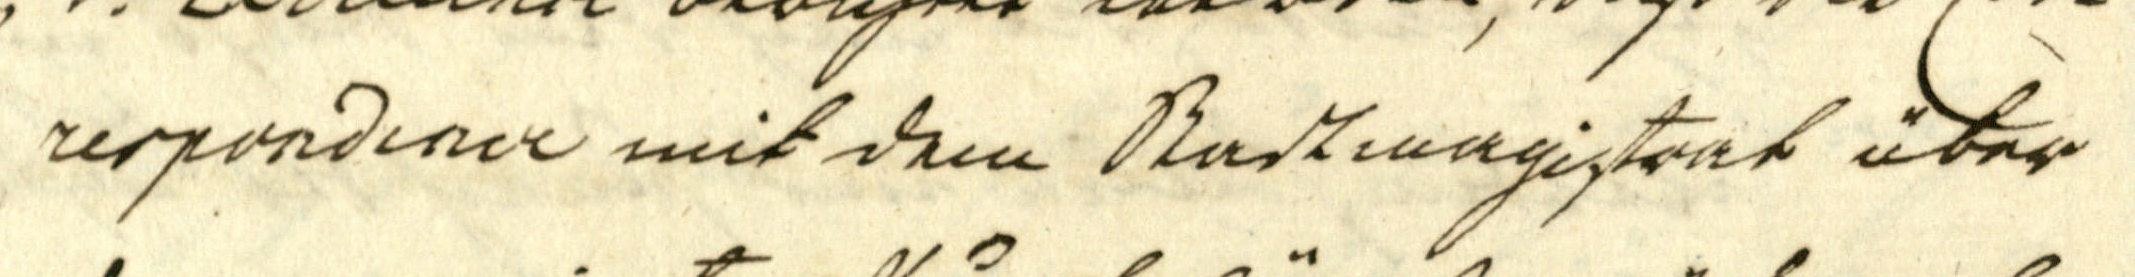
respondence mit dem Stadtmagistrat über
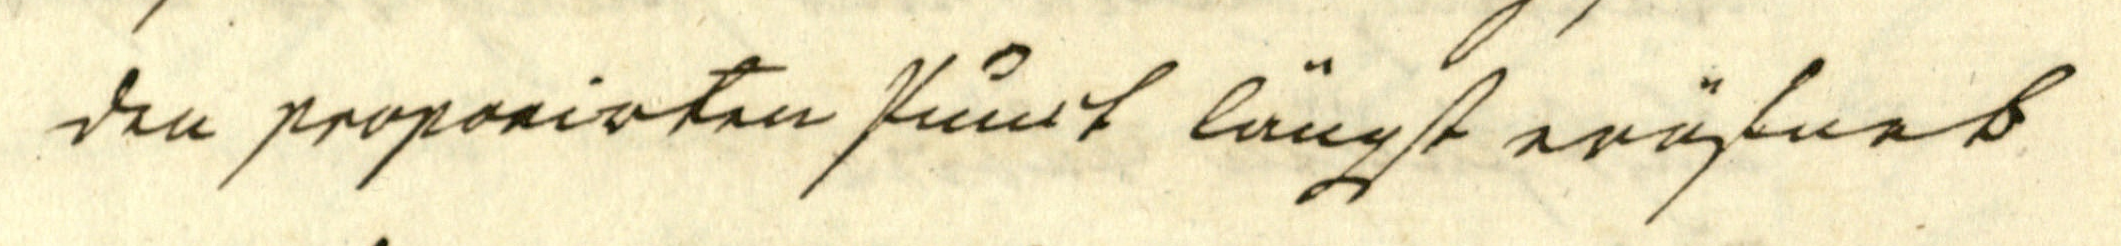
den proponirten Punct längst eröfnet
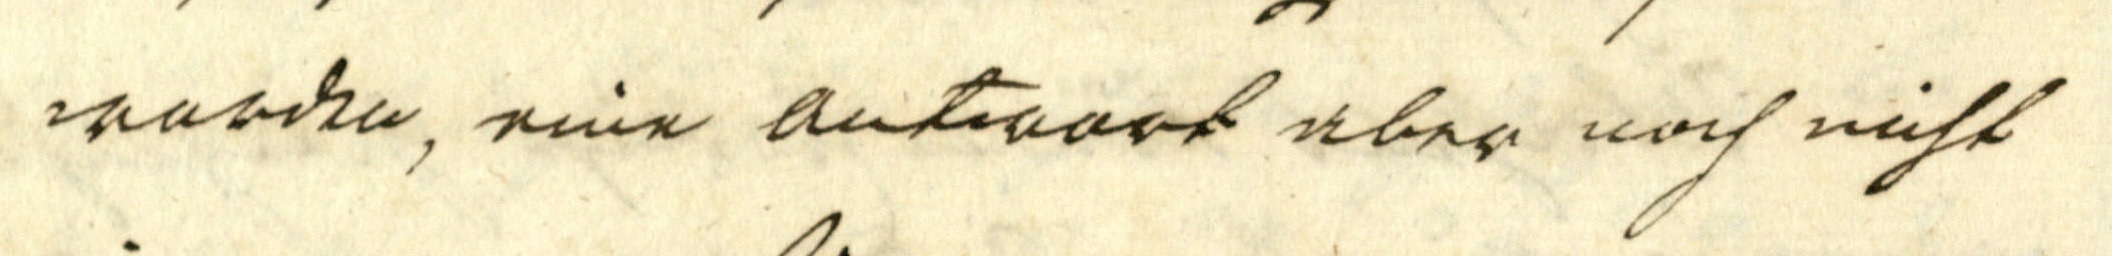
worden, eine Antwort aber noch nicht
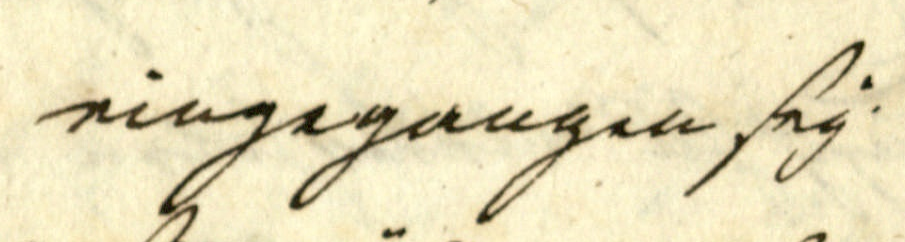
eingegangen seÿ.
